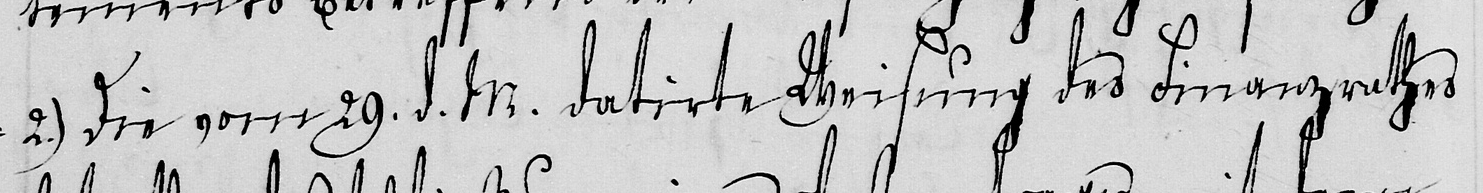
2.) Die vom 29. d. M. datirte Weisung des Finanzrathes
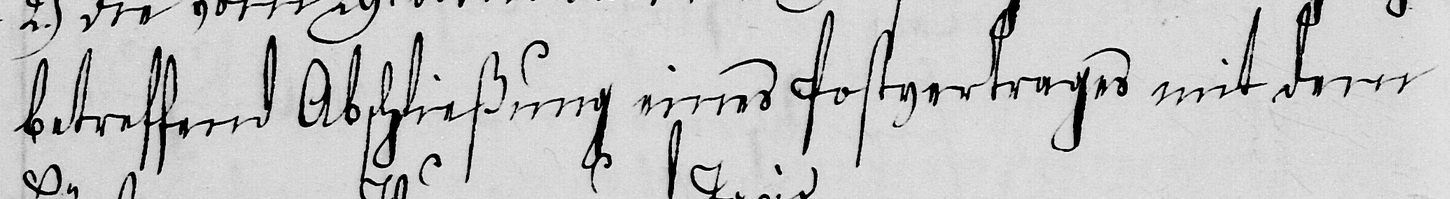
betreffend Abschließung eines Postvertrages mit dem
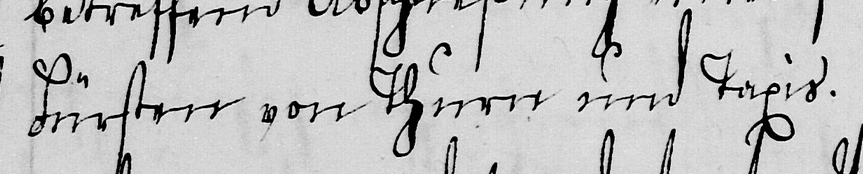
Fürsten von Thurn und Taxis.
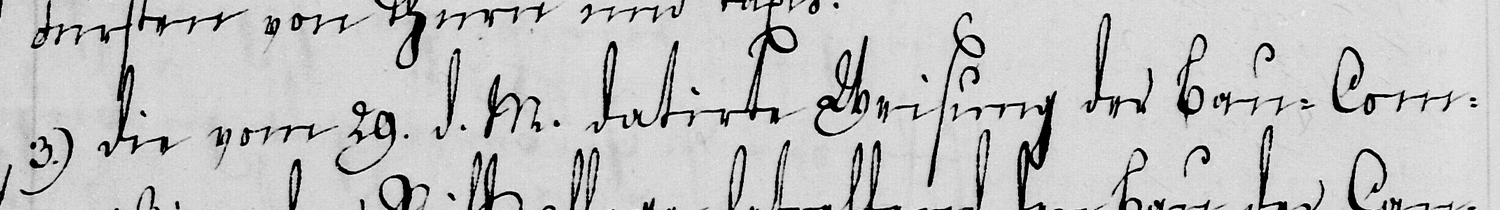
3.) die vom 29. d. M. datirte Weisung der Bau-Com¬
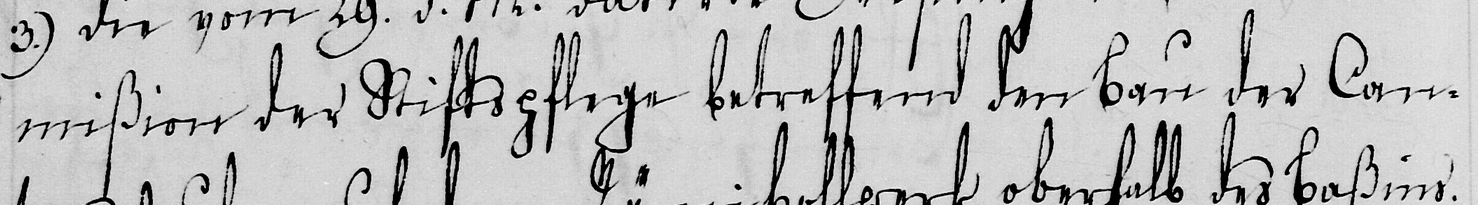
mißion der Stiftspflege betreffend den Bau der Can¬
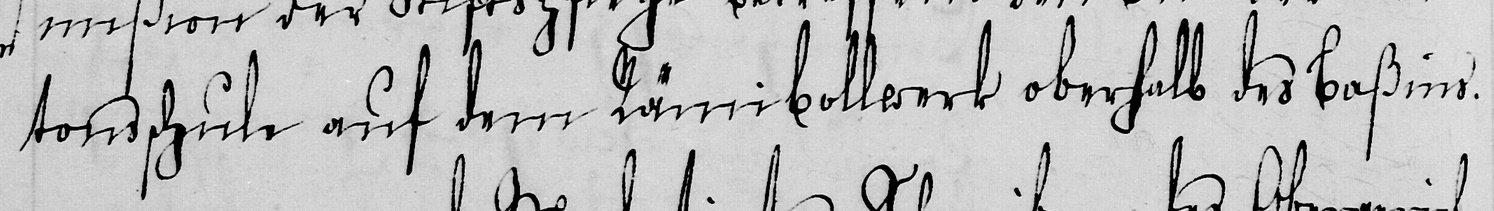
tonsschule auf dem Rämibollwerk oberhalb des Baßin¬
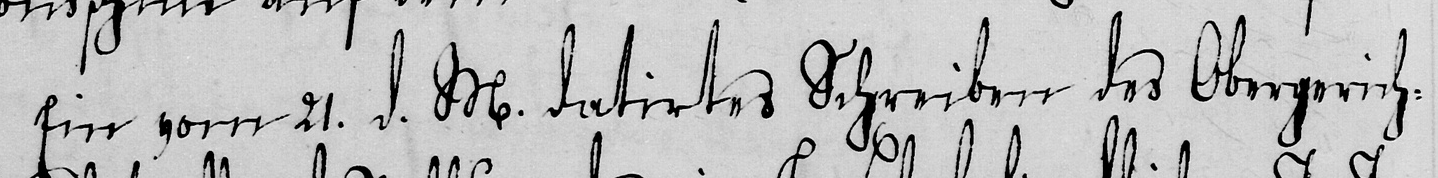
Ein vom 21. d. M. datirtes Schreiben des Obergerich¬
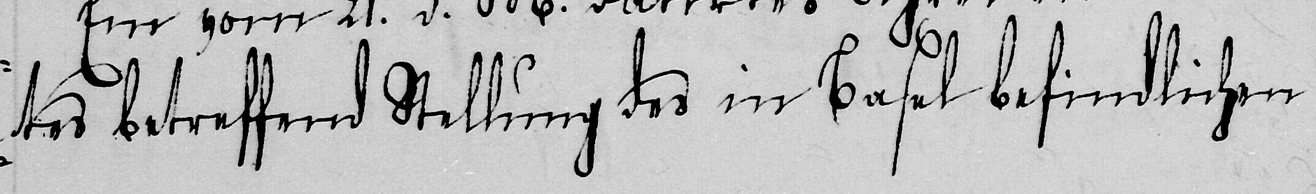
tes betreffend Stellung des in Basel befindlichen
